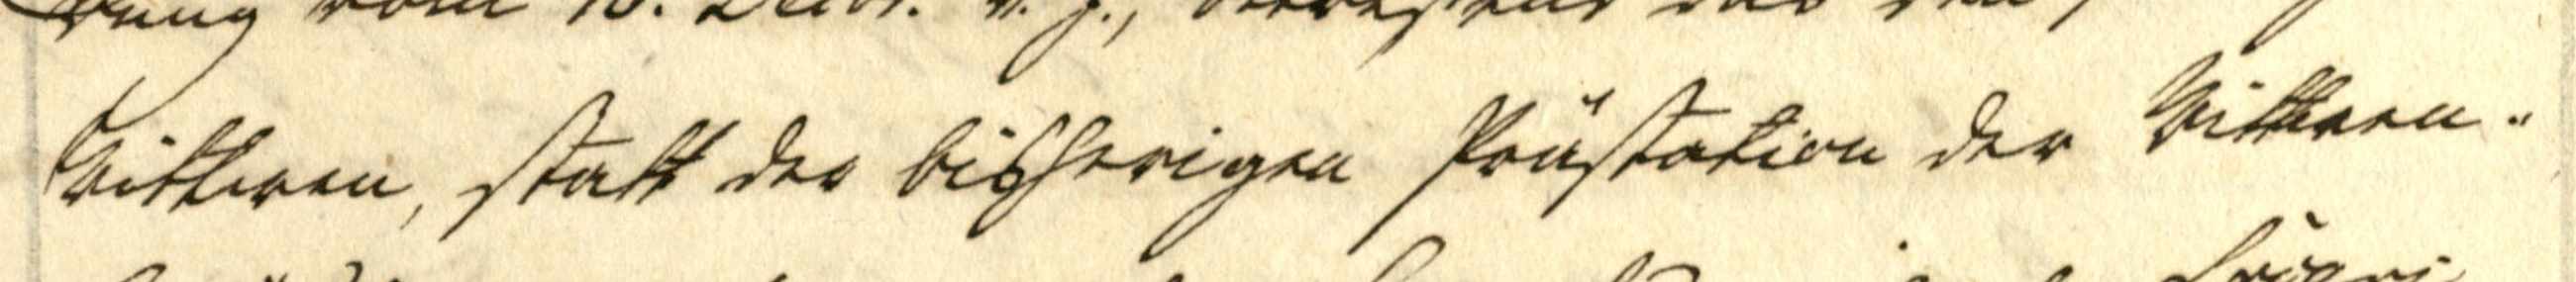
Wittwen, statt der bisherigen Prästation der Wittwen¬
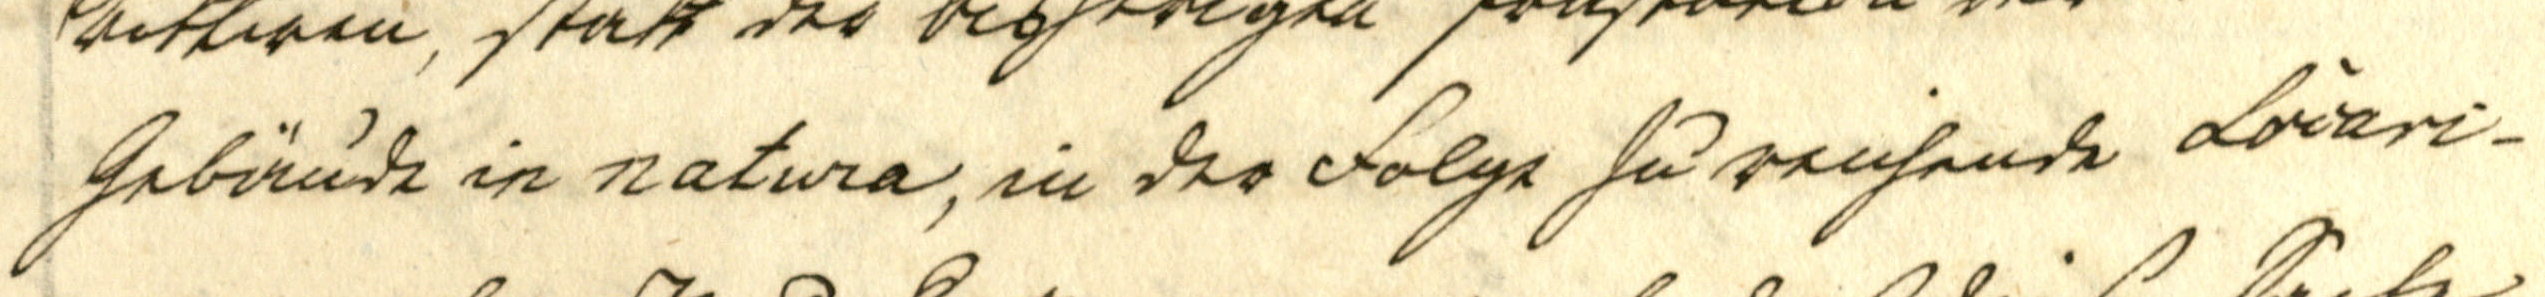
Gebäude in natura, in der Folge zu reichende Locari¬
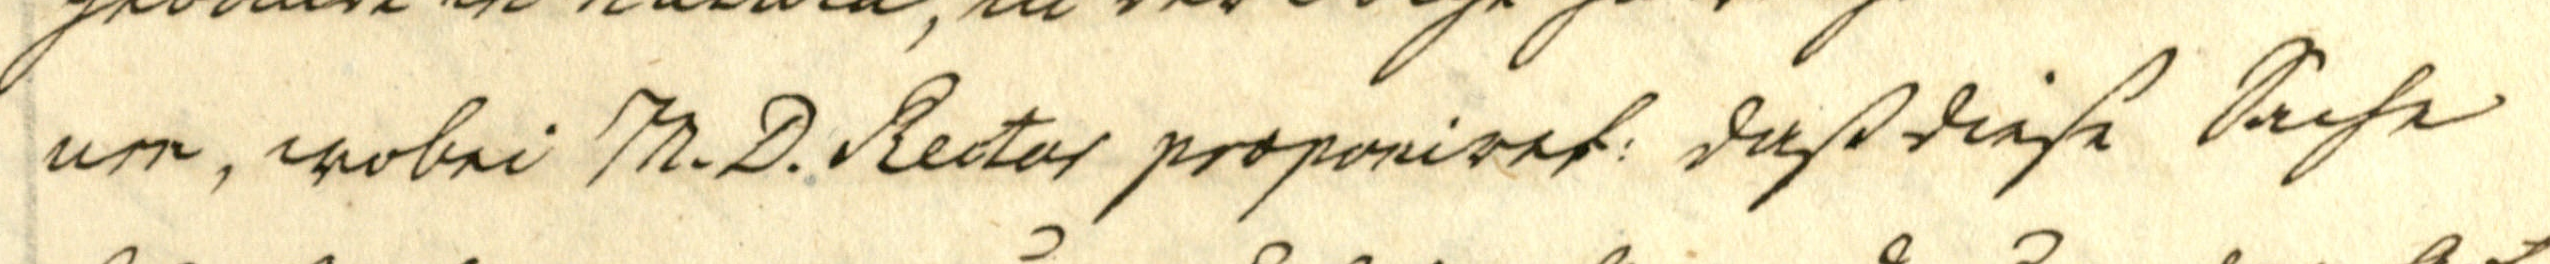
um, wobei M. D. Rector proponiret: daß diese Sache
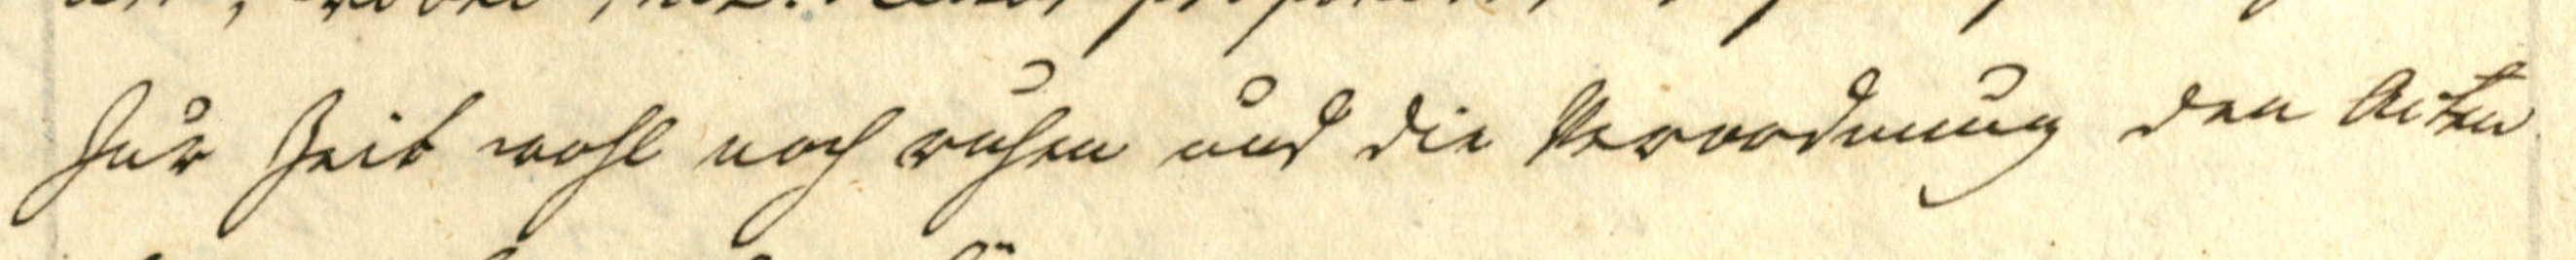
zur Zeit wohl noch ruhen und die Verordnung den Acten
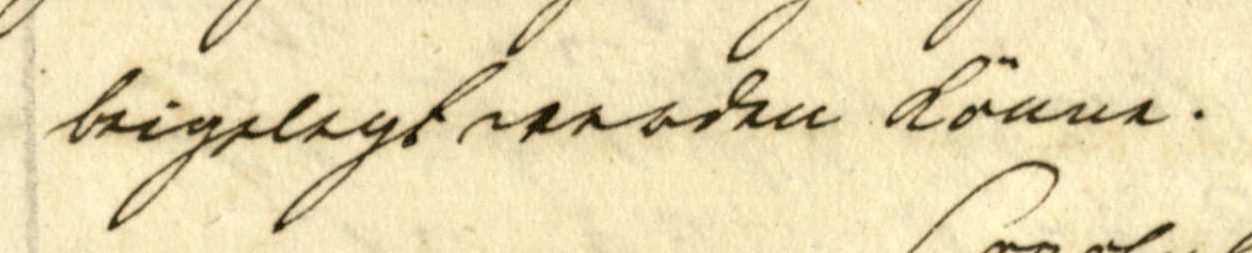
beigelegt werden könne.
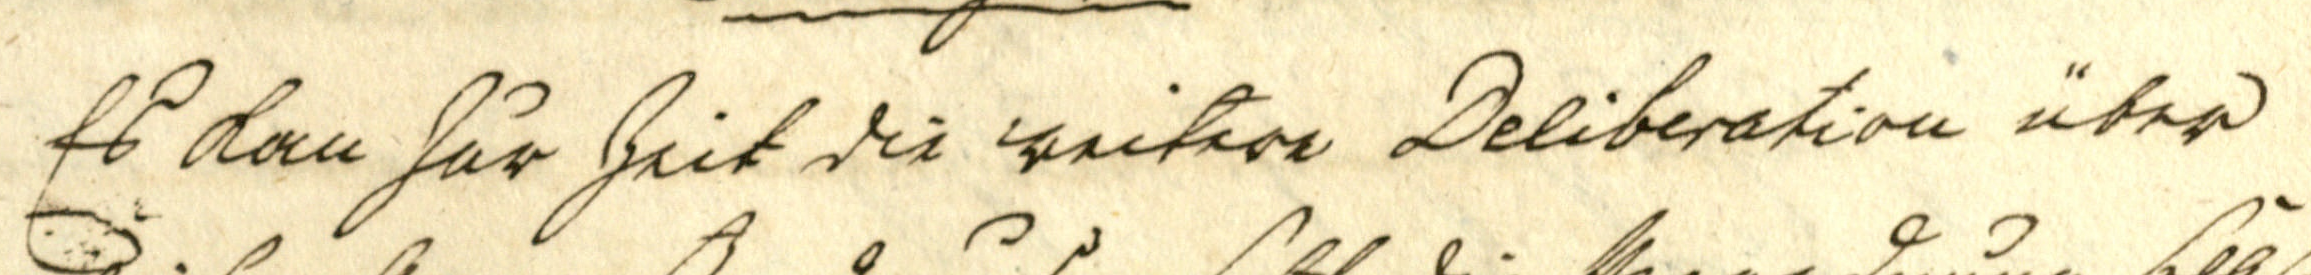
Es kan zur Zeit die weitere Deliberation über
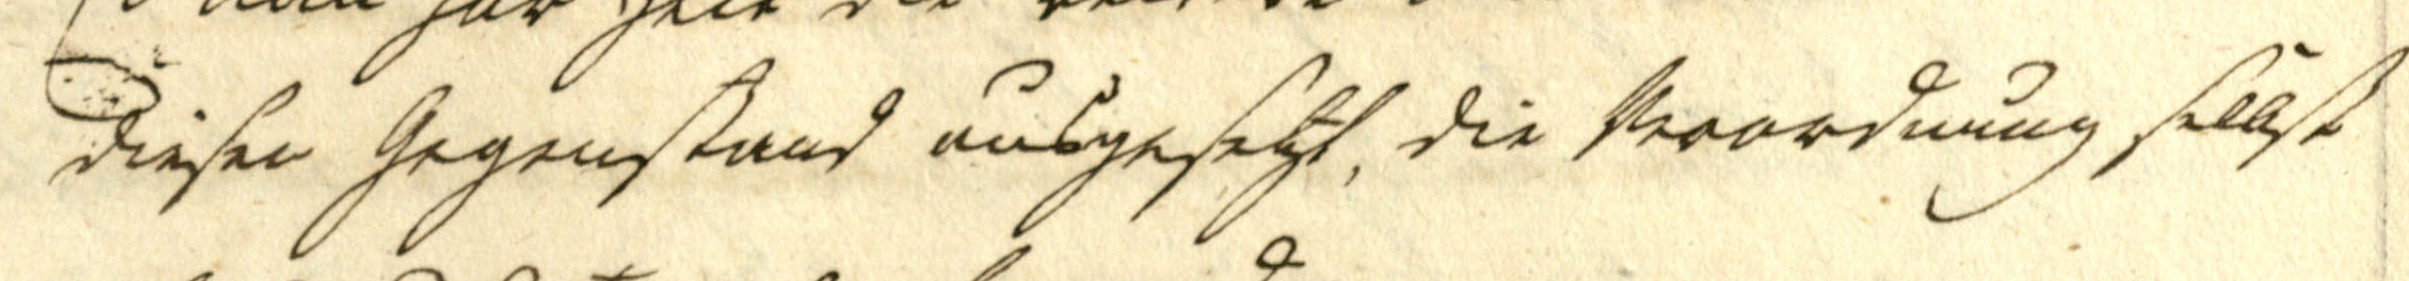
diesen Gegenstand ausgesetzt, die Verordnung selbst
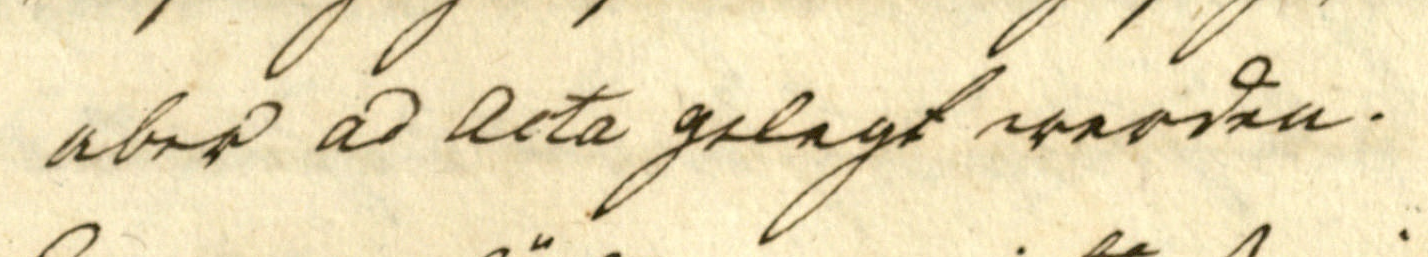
aber ad Acta gelegt werden.
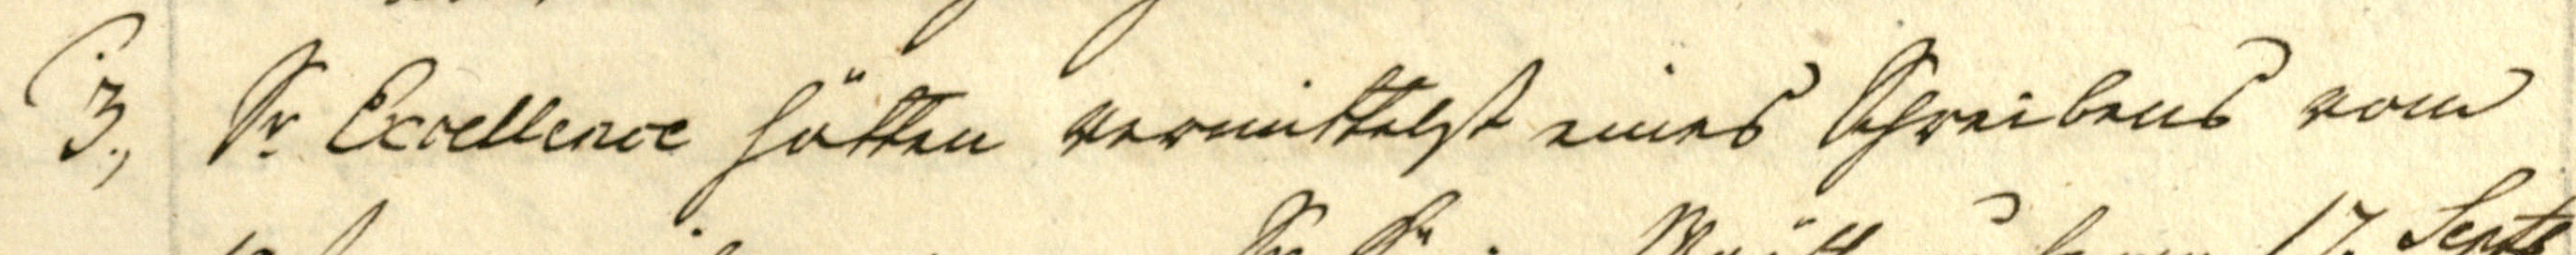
3., Sr Excellence hätten vermittelst eines Schreibens vom
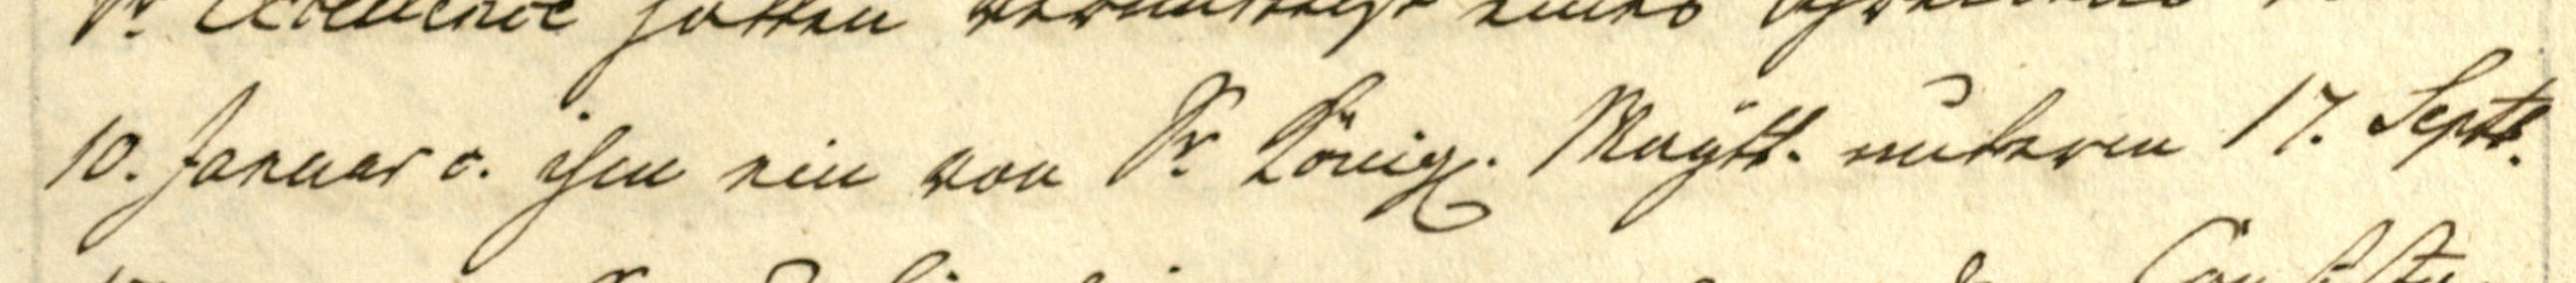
10.Januar c. ihm ein von Sr Königl. Maÿtt. unterm 17. Septb.
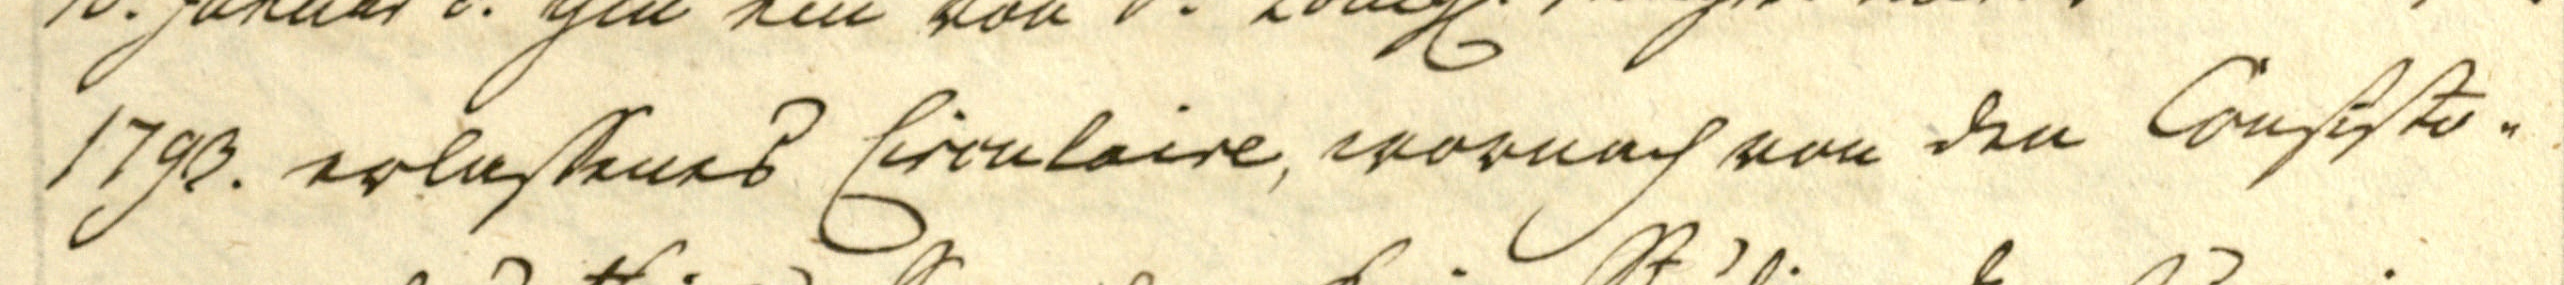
1793. erlassenes Circulaire, wornach von den Consisto¬
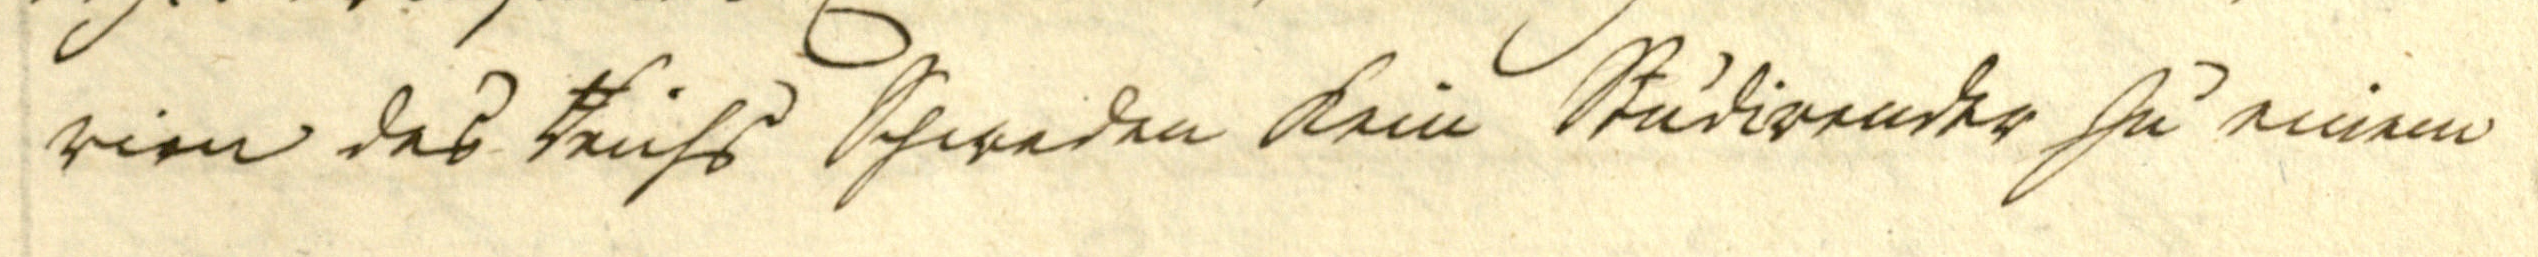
rien des Reichs Schweden kein Studirender zu einem
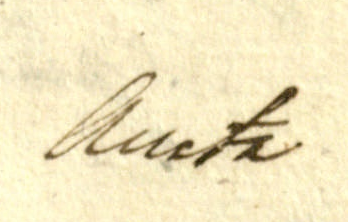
Amte
